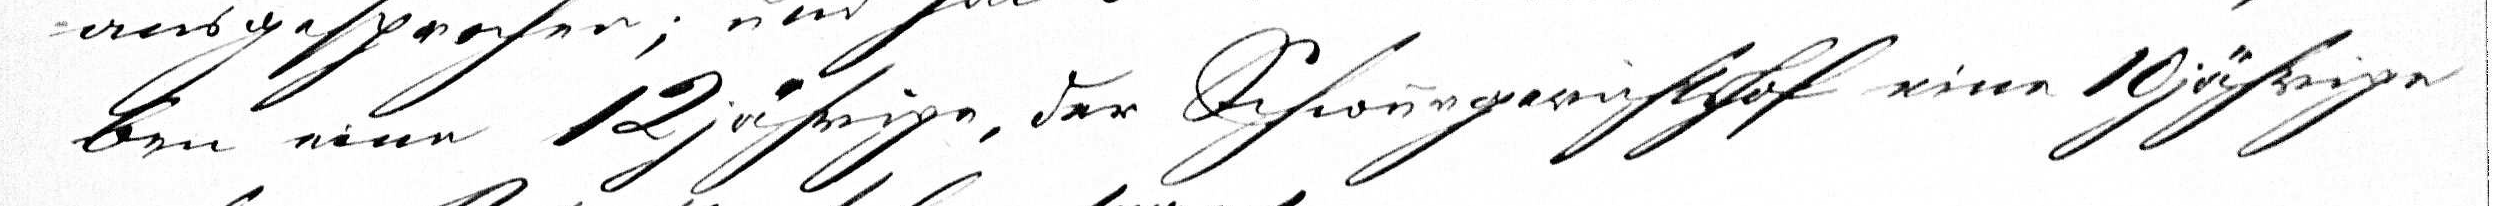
ben eine 12jährige, der Schwurgerichthof eine 10jährige
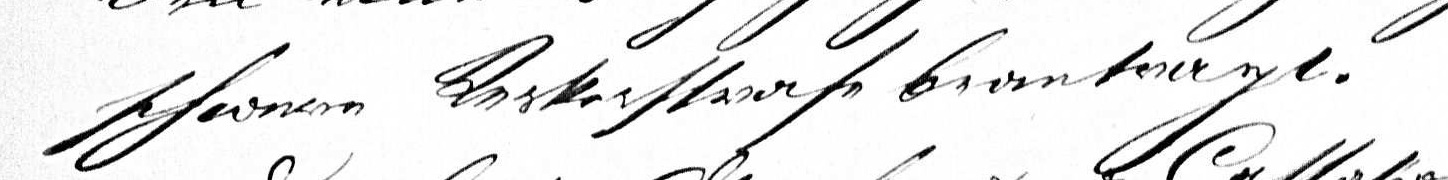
schwere Kerkerstrafe beantragt.
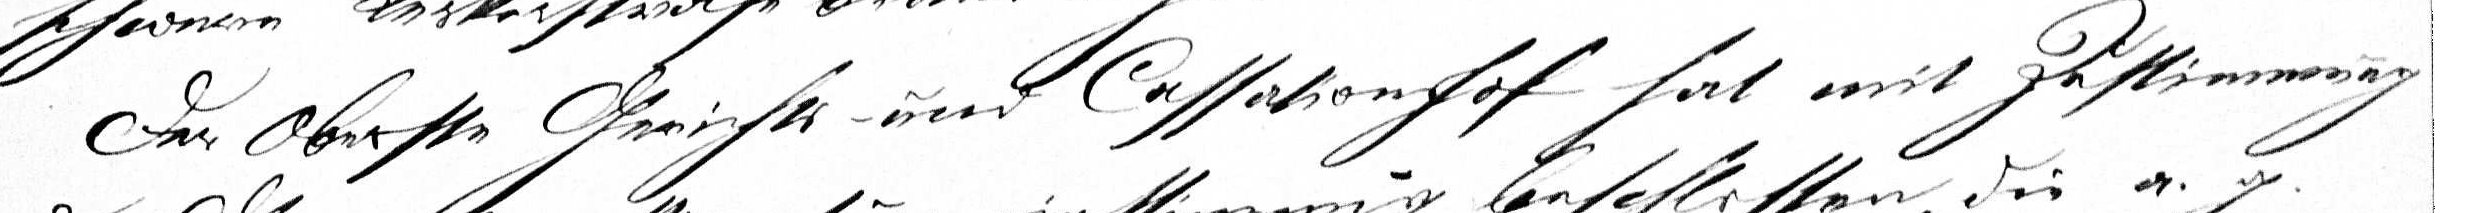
Der Oberste Gerichts- und Cassationshof hat mit Zustimmung
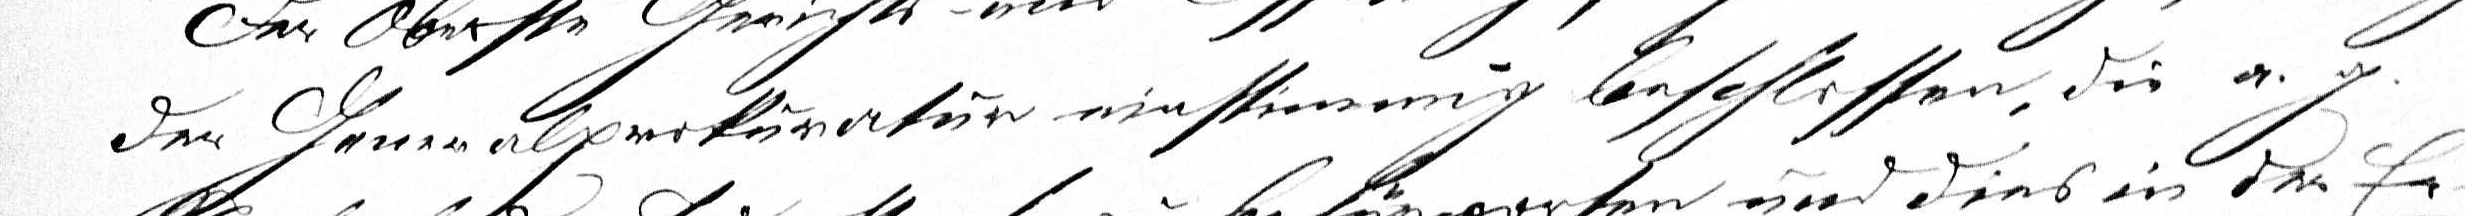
der Generalprokuratur einstimmig beschlossen, die a. g.
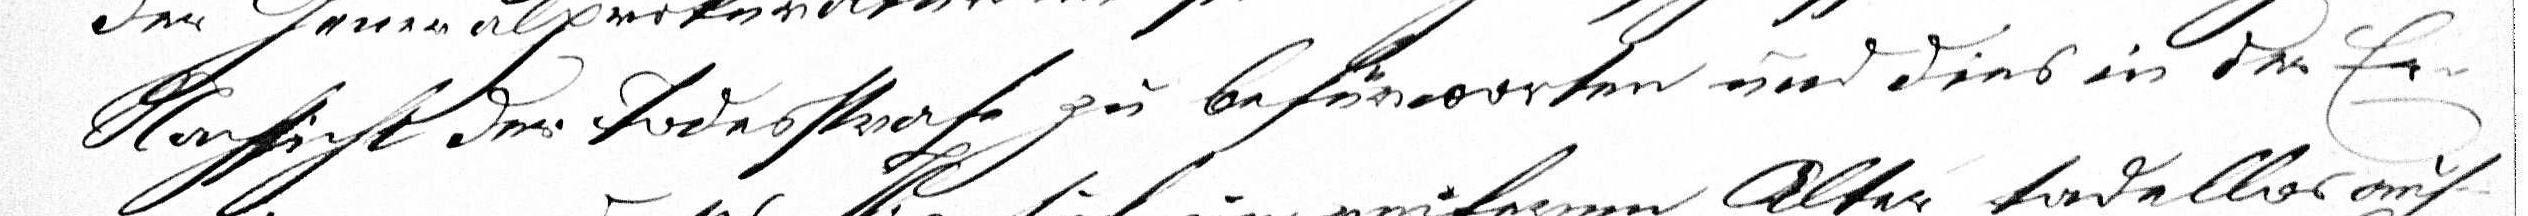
Nachsicht der Todesstrafe zu befürworten und dies in der Er¬
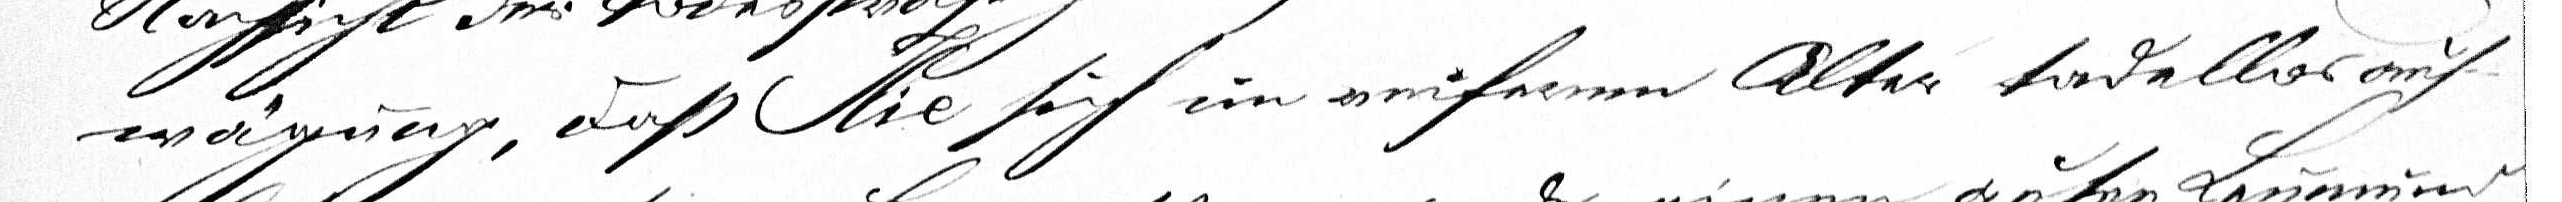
wägung, daß Jlie sich im reiferen Alter tadellos auf¬
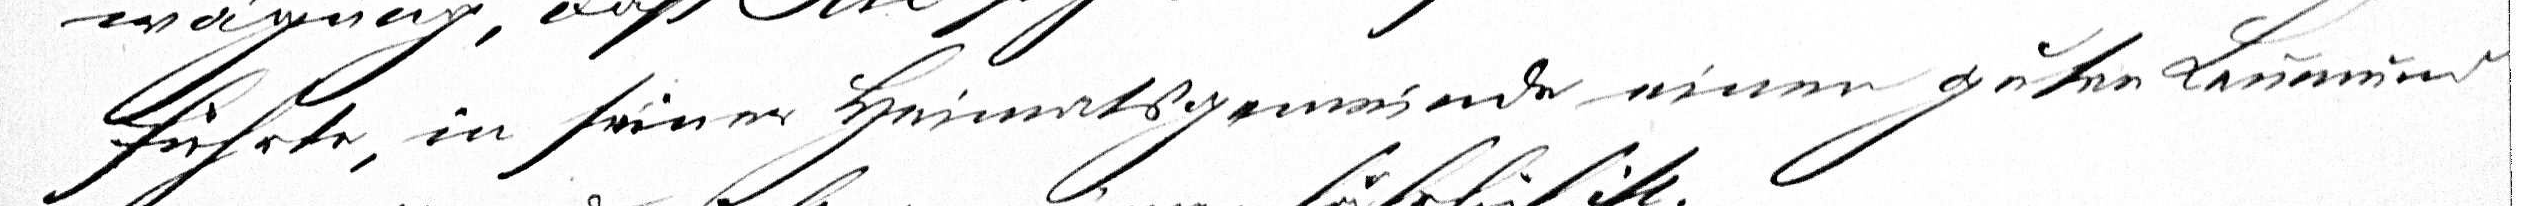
führte, in seiner Heimatsgemeinde einen guten Leunxx
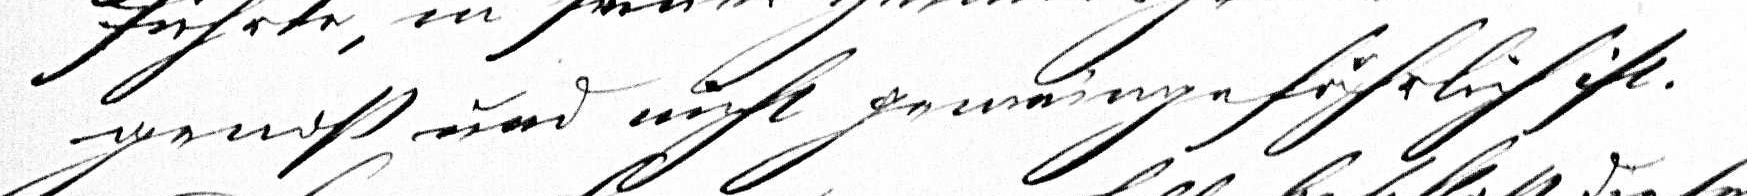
genoß und nicht gemeingefährlich ist.
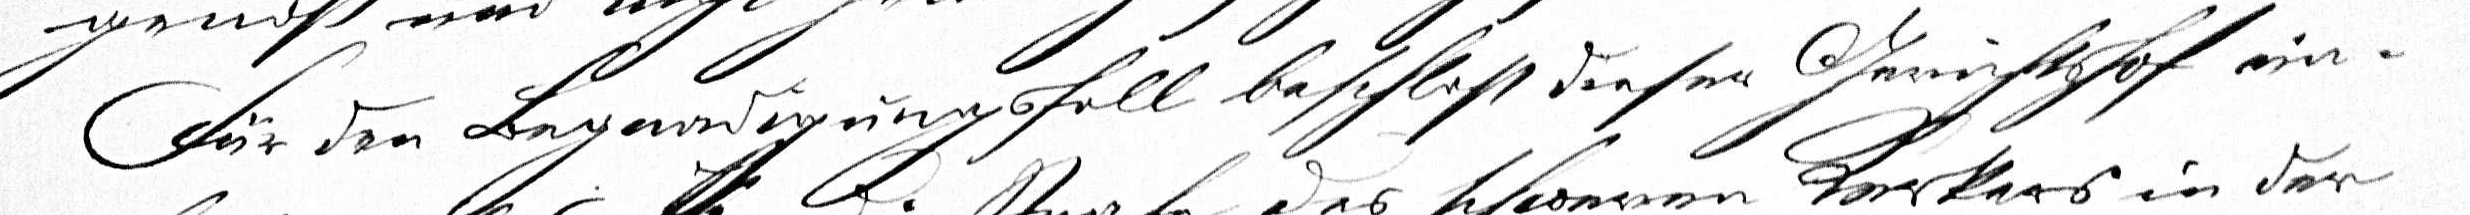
Für den Begnadigungsfell beschloß dieser Gerichtshof ein¬
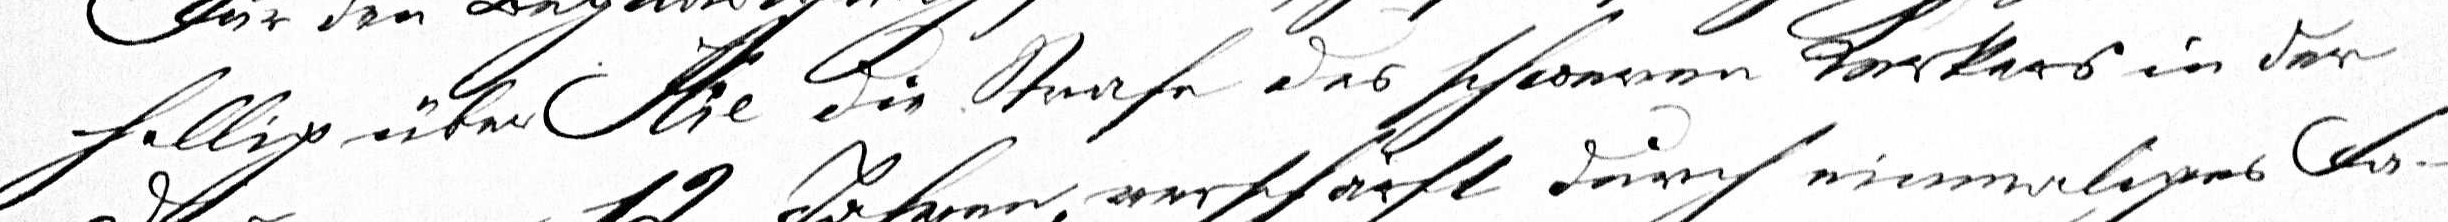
hellig über Jlie die Strafe des schweren Kerkers in der
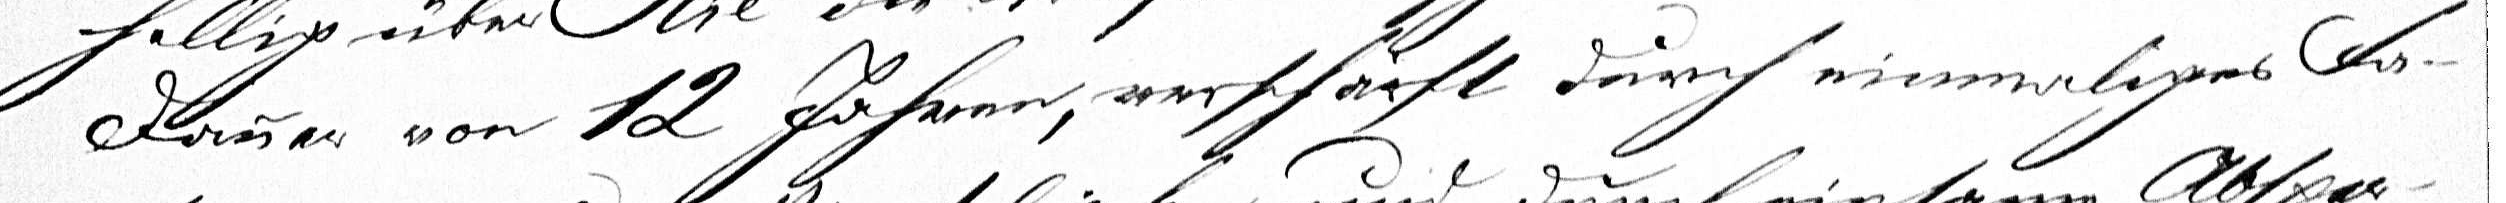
Dauer von 12 Jahren, verschärft durch einmaliges Fa¬
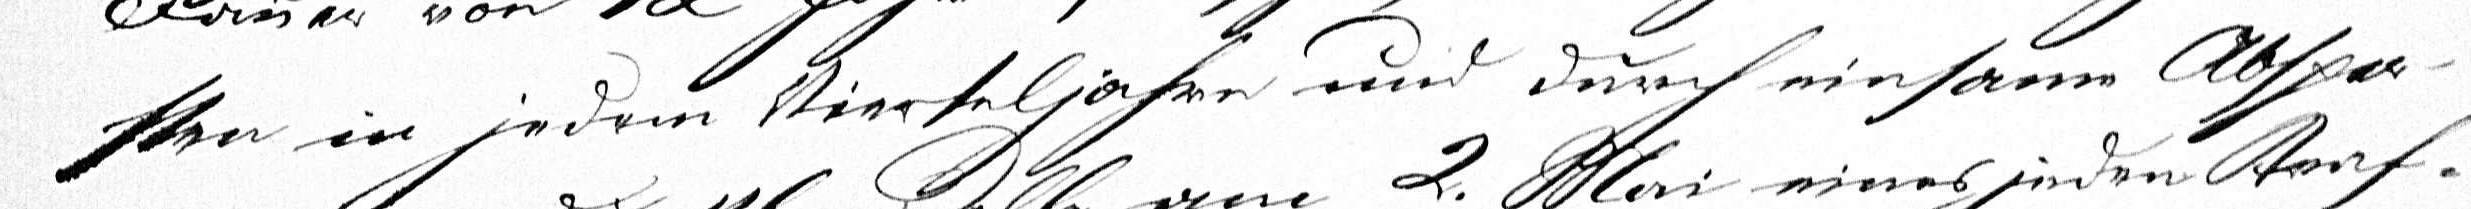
sten in jedem Vierteljahre und durch einsame Absper¬
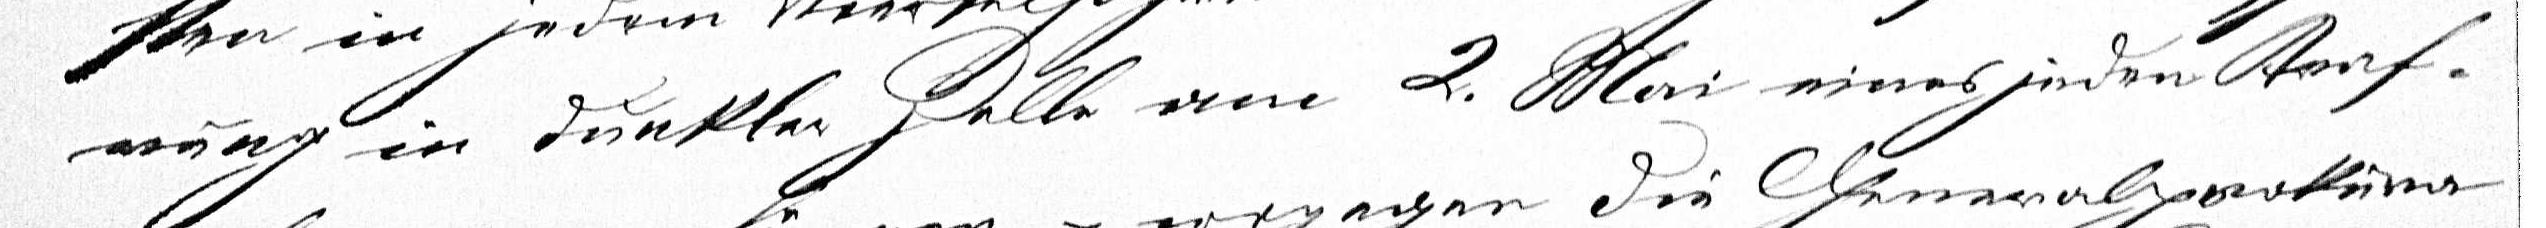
rung in Dunkler Zelle am 2. Mai eines jeden Straf¬
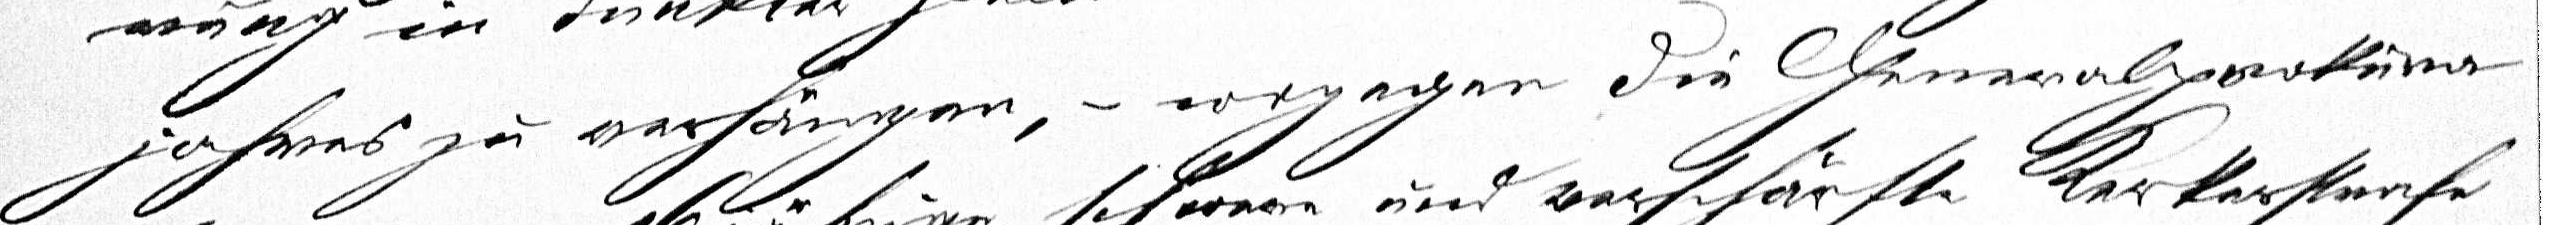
jahres zu verhängen, - wegegen die Generalprokura¬
